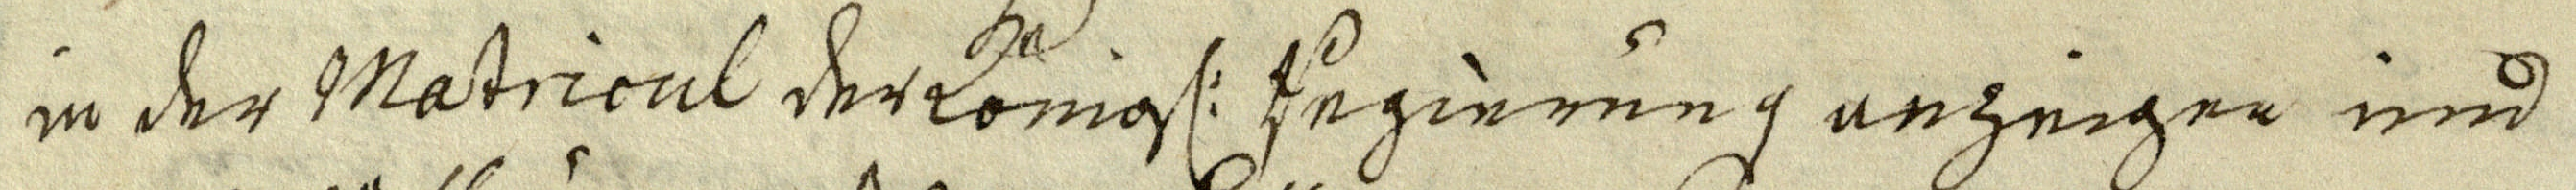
in der Matricul der Königl. Regierung anzeigen und
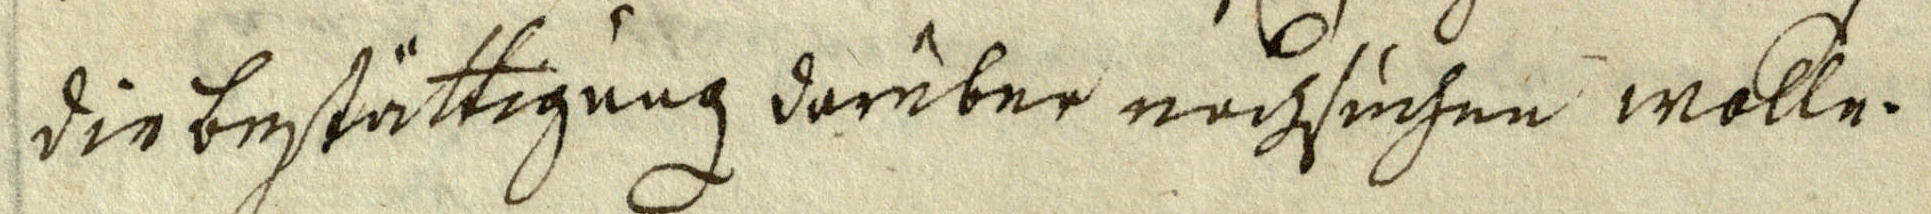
die Bestättigung darüber nachsuchen wolle.
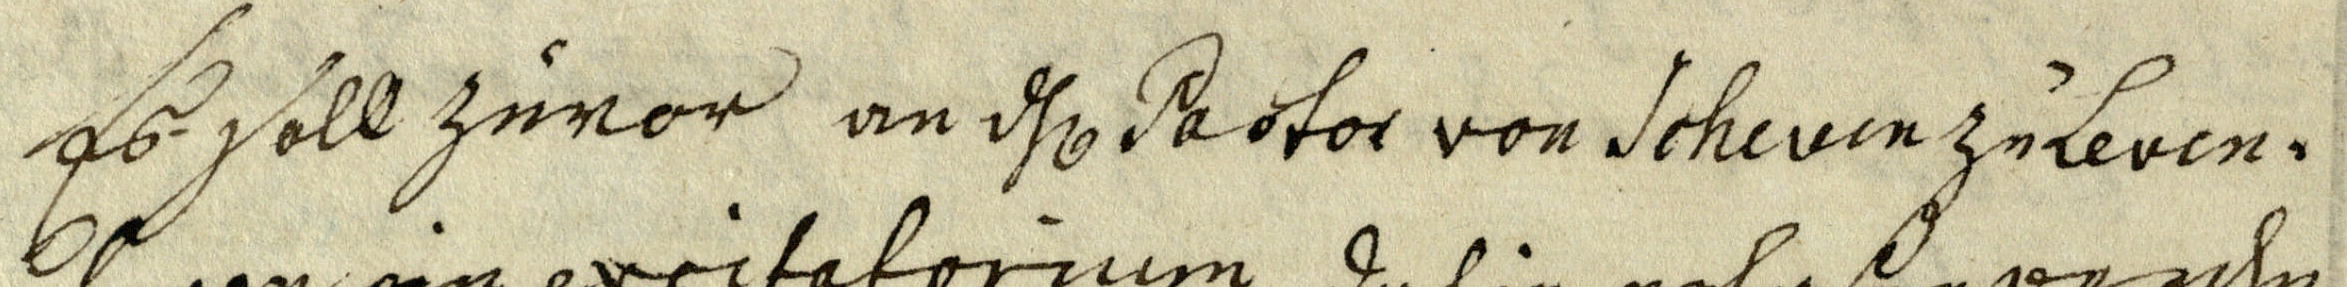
Es soll zuvor dh Pastor von Scheven zu Leven¬
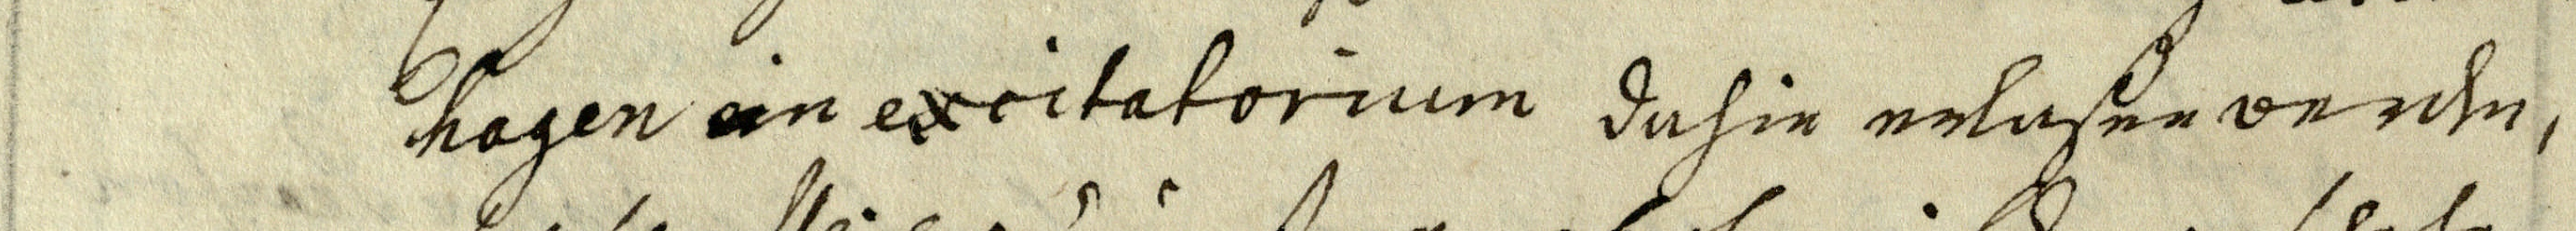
hagen ein excitatorium dahin erlaßen werden,
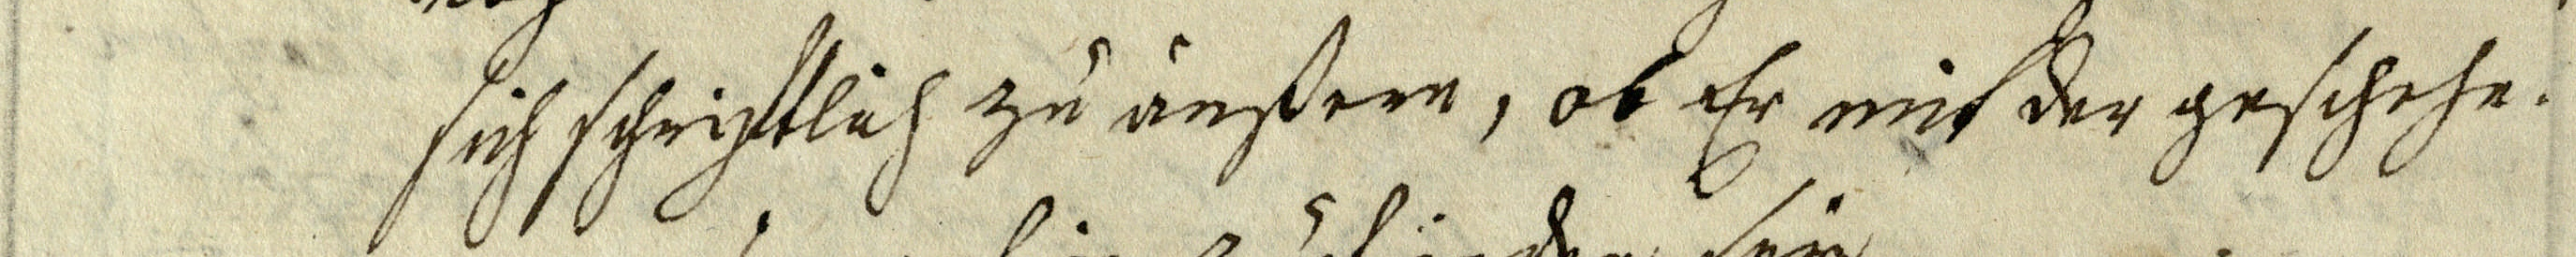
sich schriftlich zu äußern, ob Er mit der geschehe¬
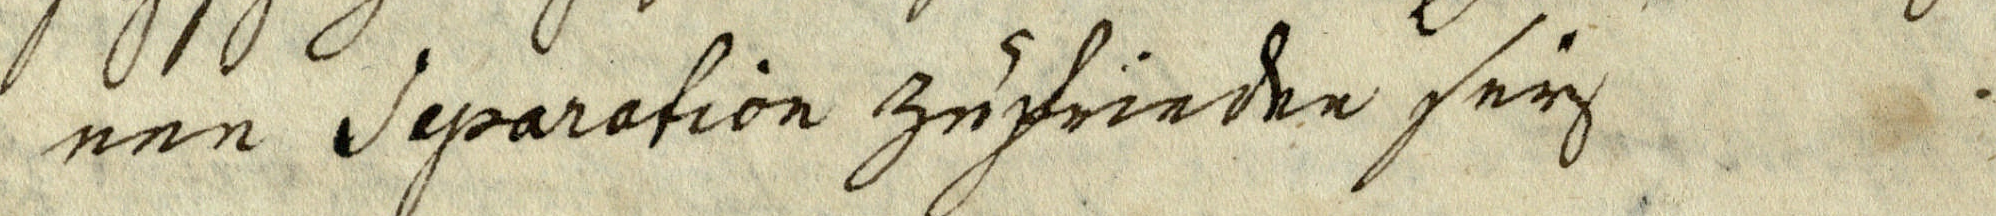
nen Separation zufrieden seÿ.
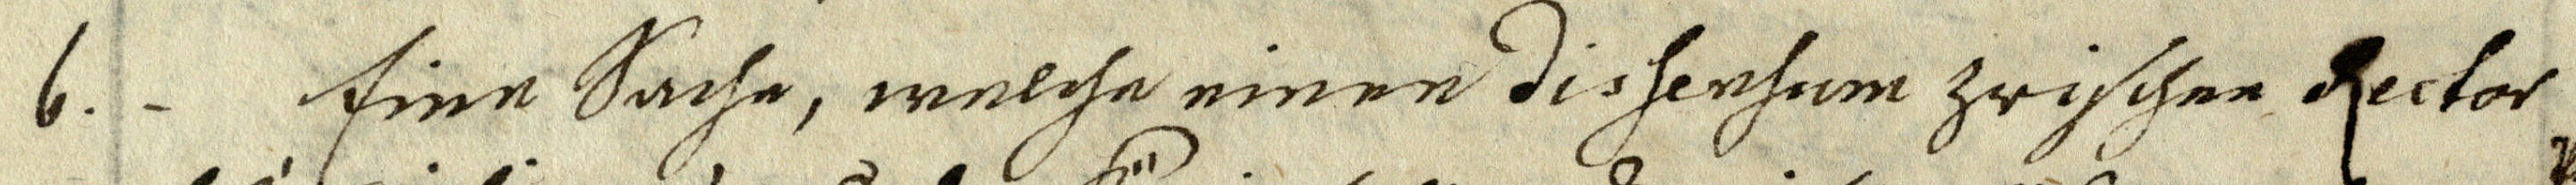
6. Eine Sache, welche einen dissensum zwischen Rector
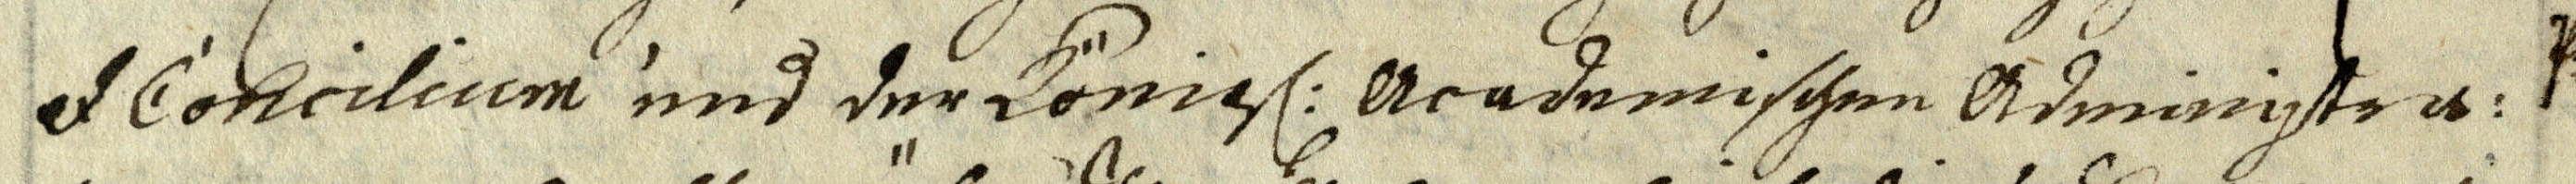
et Cocilium und der Königl. Academischen Administra¬
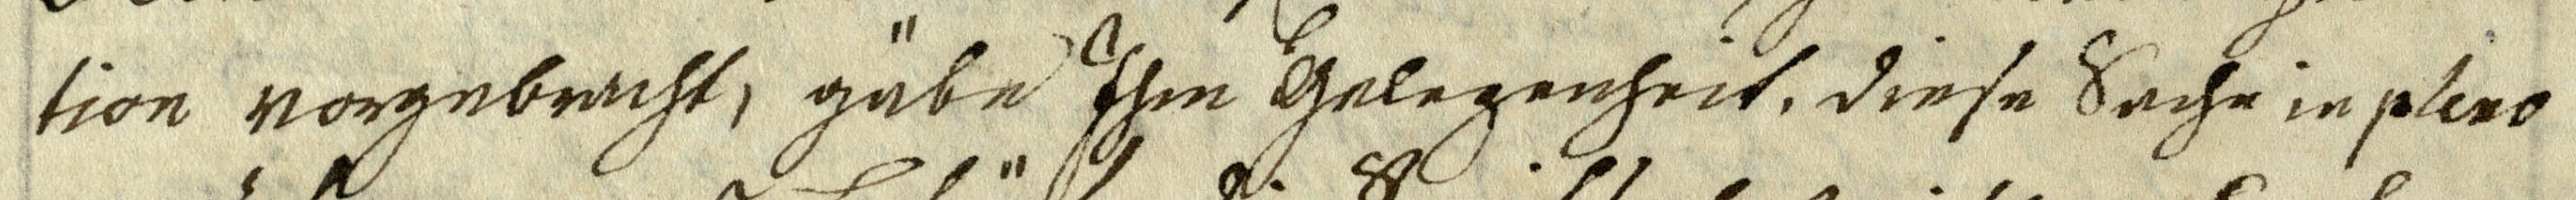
tion vorgebracht, gäbe Ihm Gelegenheit, diese Sache in pleno
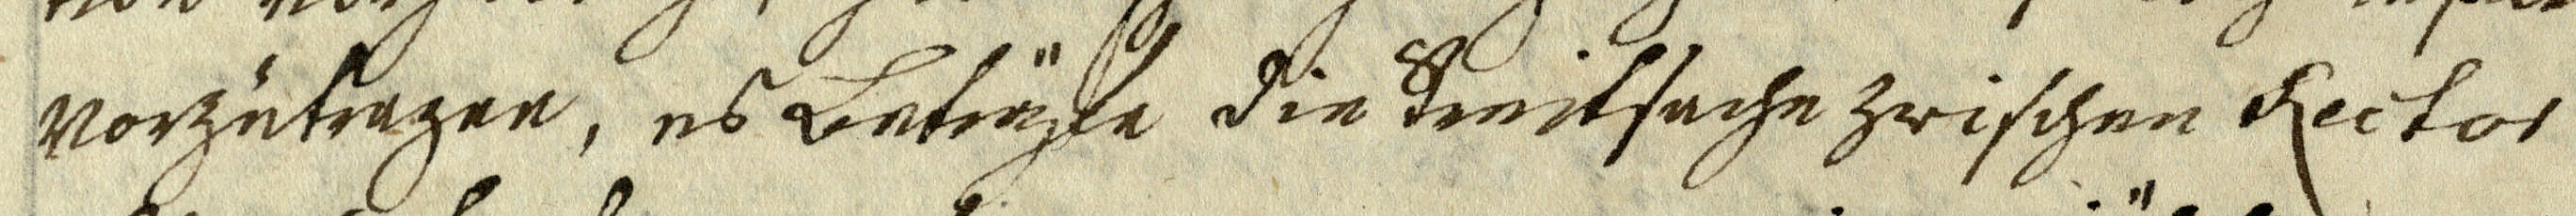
vorzutragen, es beträfe die Streitsache zwischen Rector
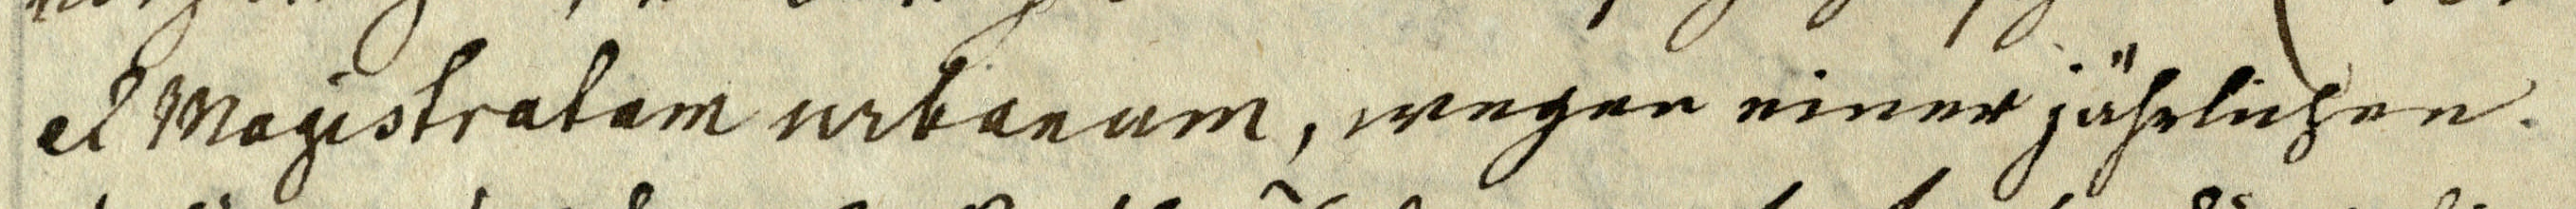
et Magistratam urbanum, wegen einer jährlichen
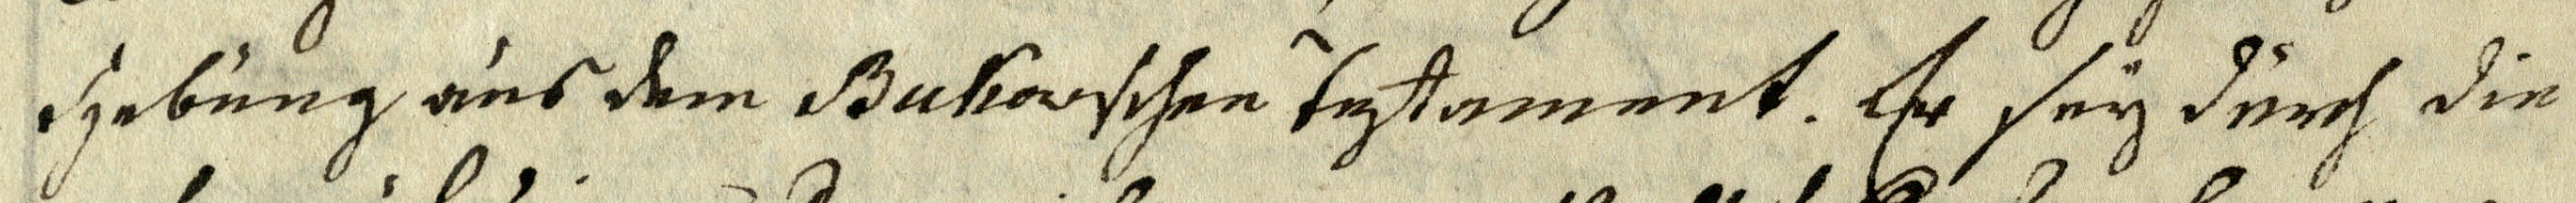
Hebung aus dem Bukowschen Testament. Er seÿ durch die
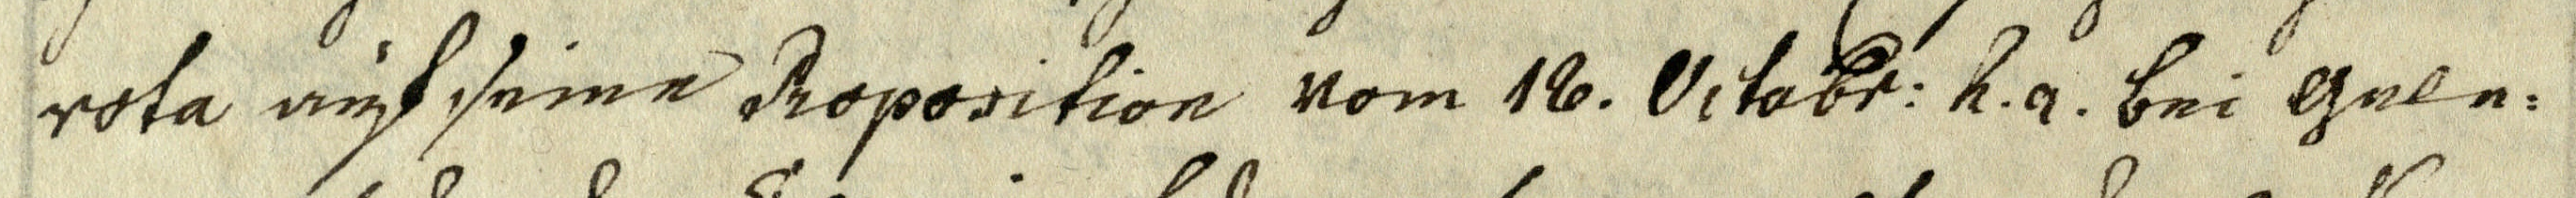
vota auf seine Proposition vom 18. Octobr. h. a. bei Gele¬
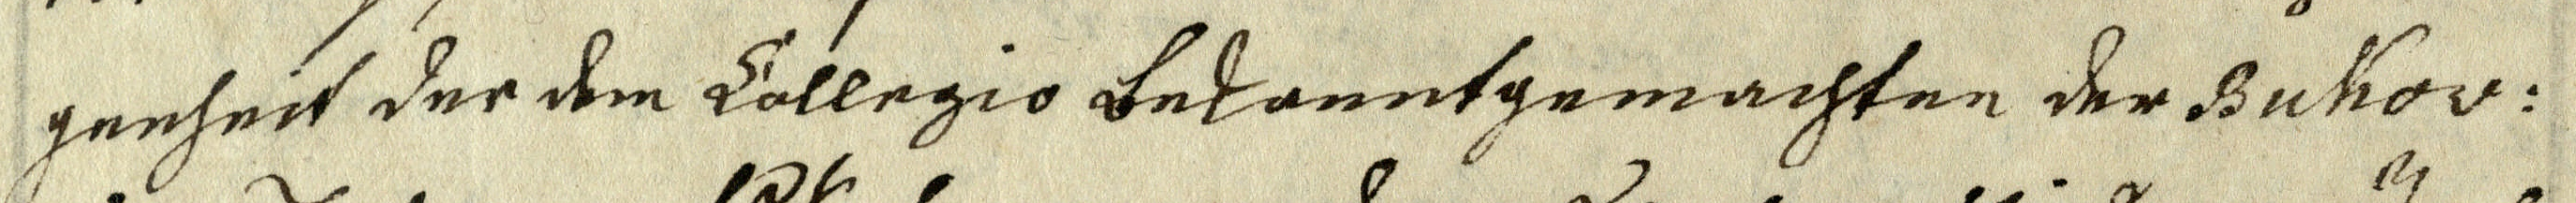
genheit der dem Collegio bekanntgemachten der Bukow¬
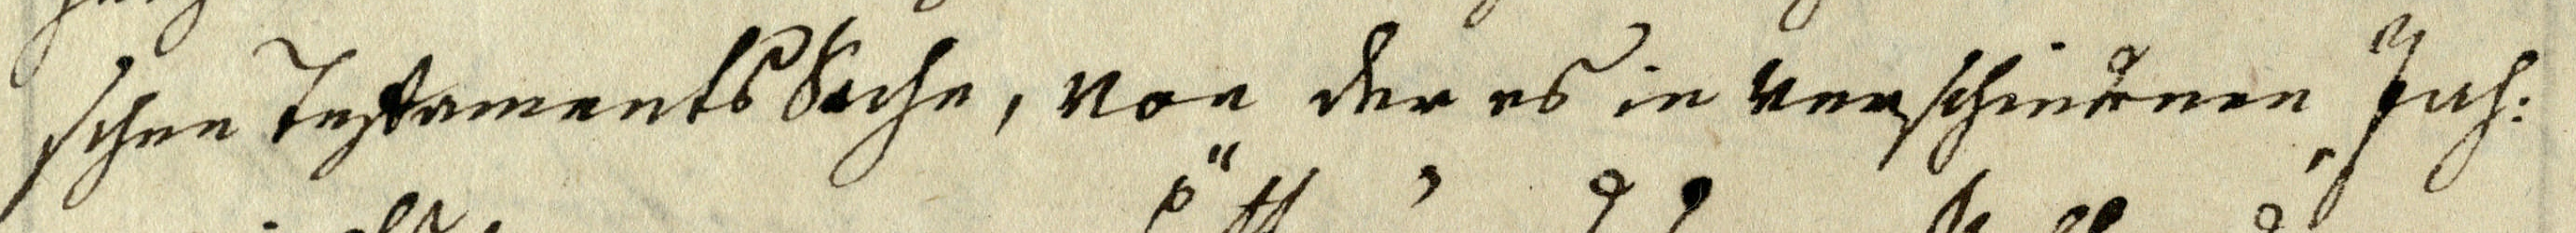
schen Testaments Sache, von der es in verschiedenen Jah¬
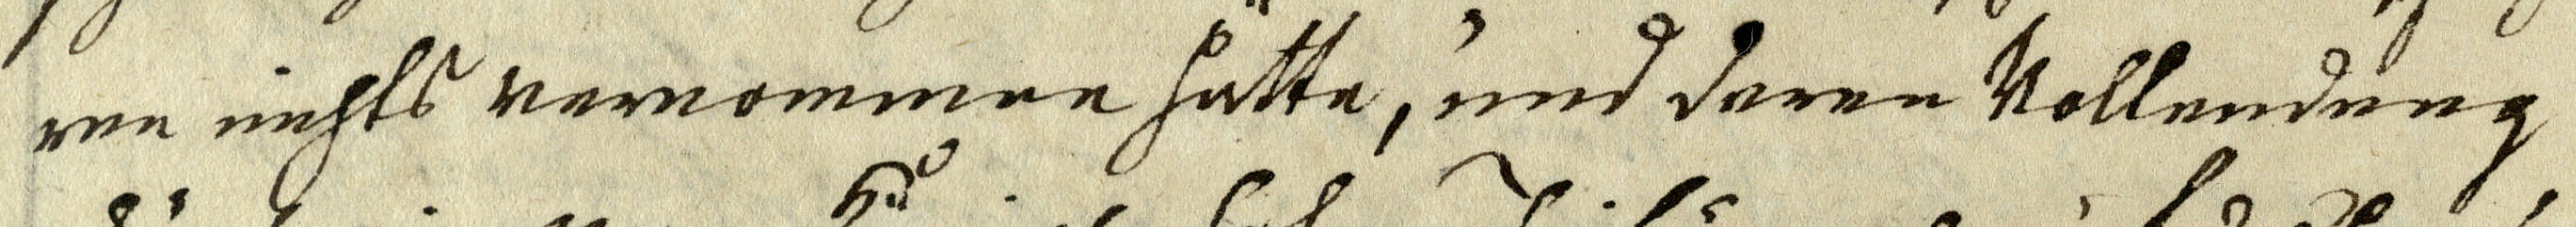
ren nichts vernommen hätte, und deren Vollendung
